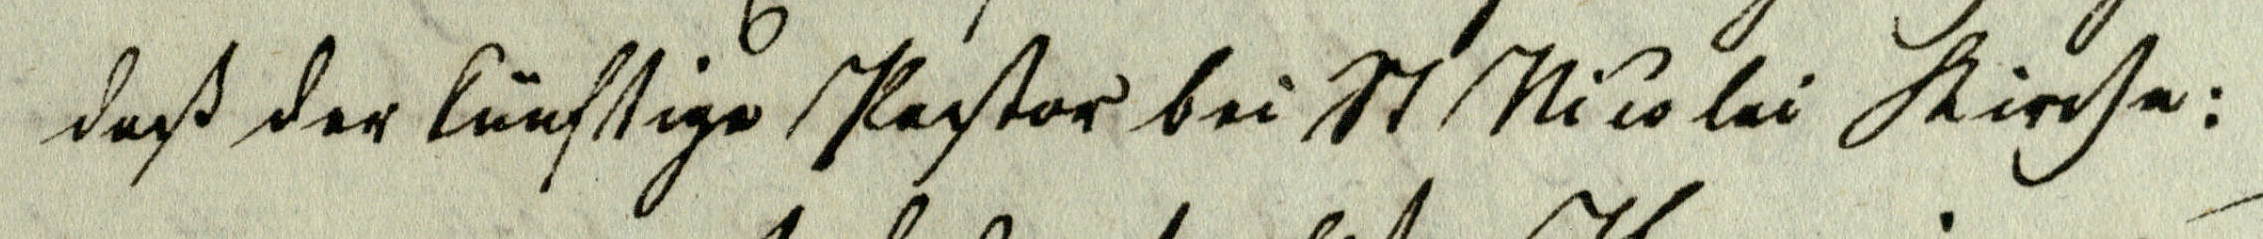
daß der künftige Pastor bei St. Nicolai Kirche:
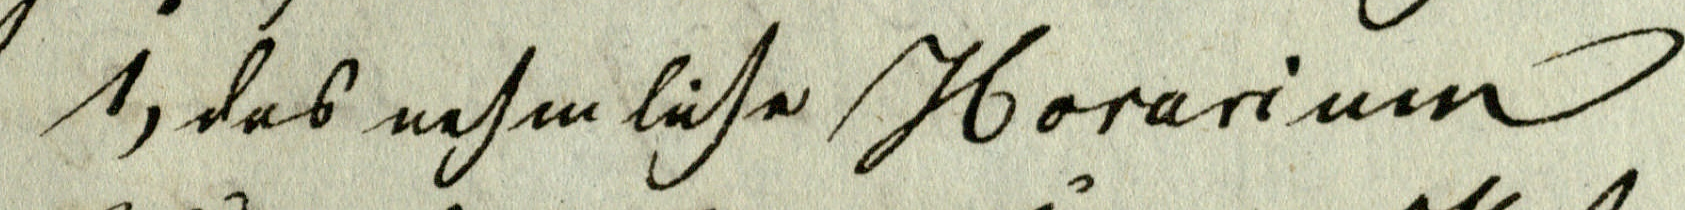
1, das nehmliche Horarium
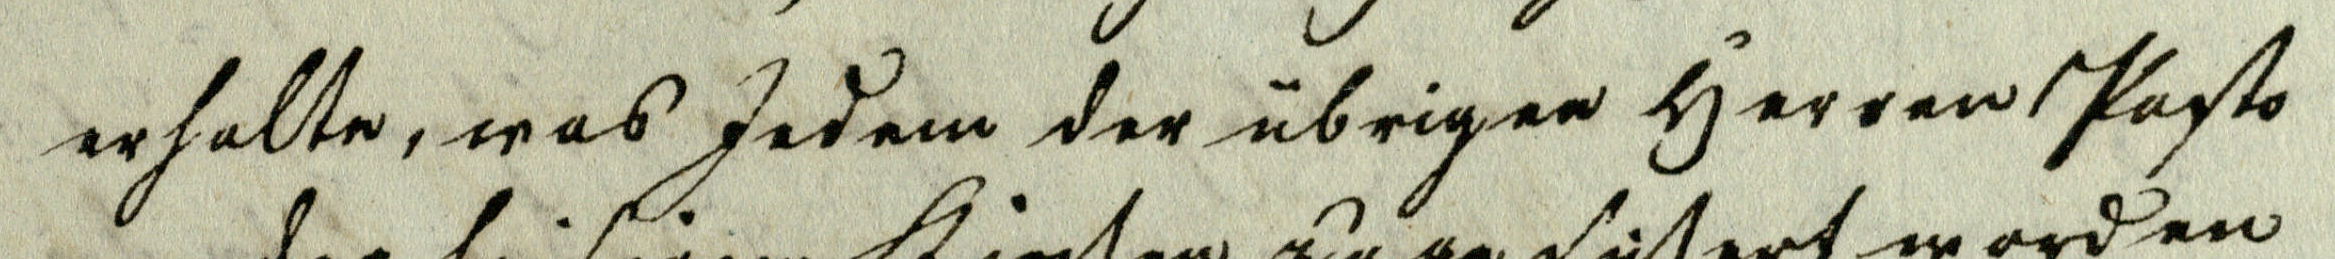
erhalte, was Jedem der übrigen Herren Pasto¬
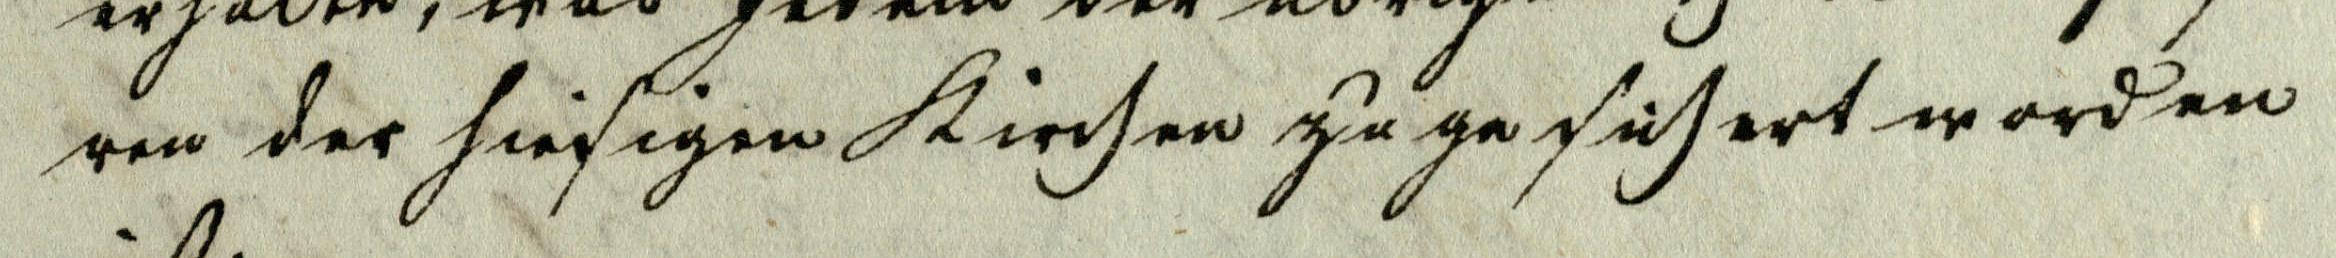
ren der hiesigen Kirchen zugesichert worden
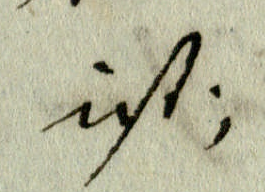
ist;
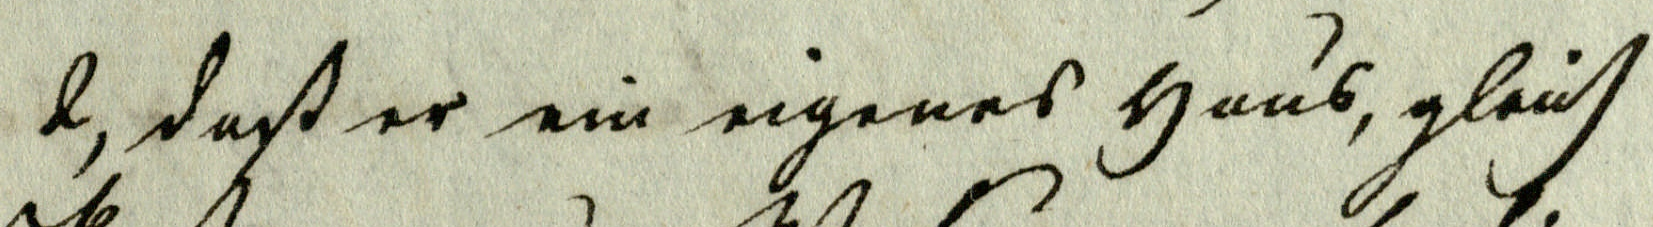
2, daß er ein eigenes Haus, gleich
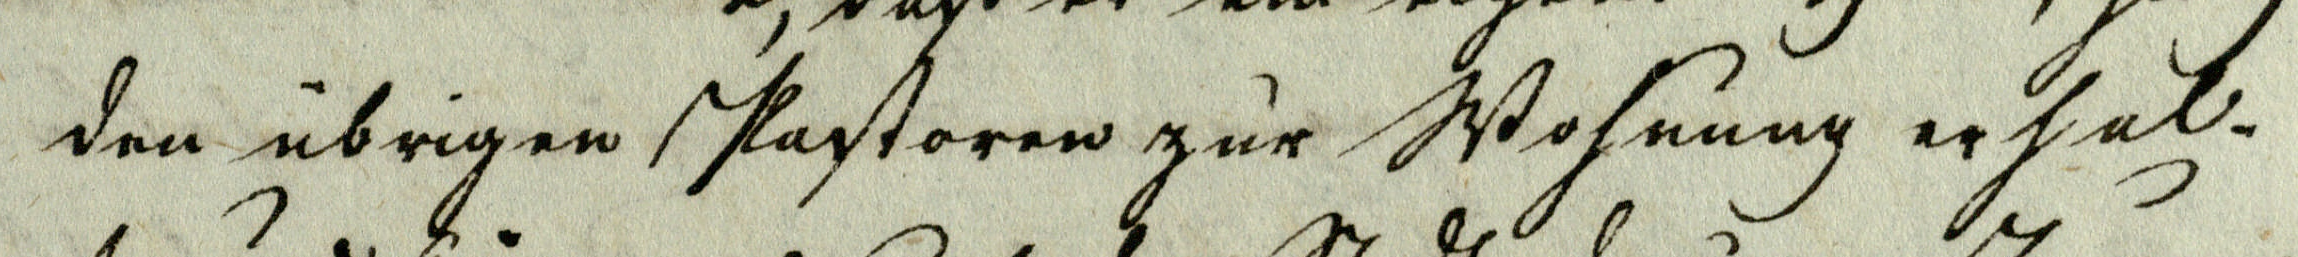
den übrigen Pastoron zur Wohnung erhal¬
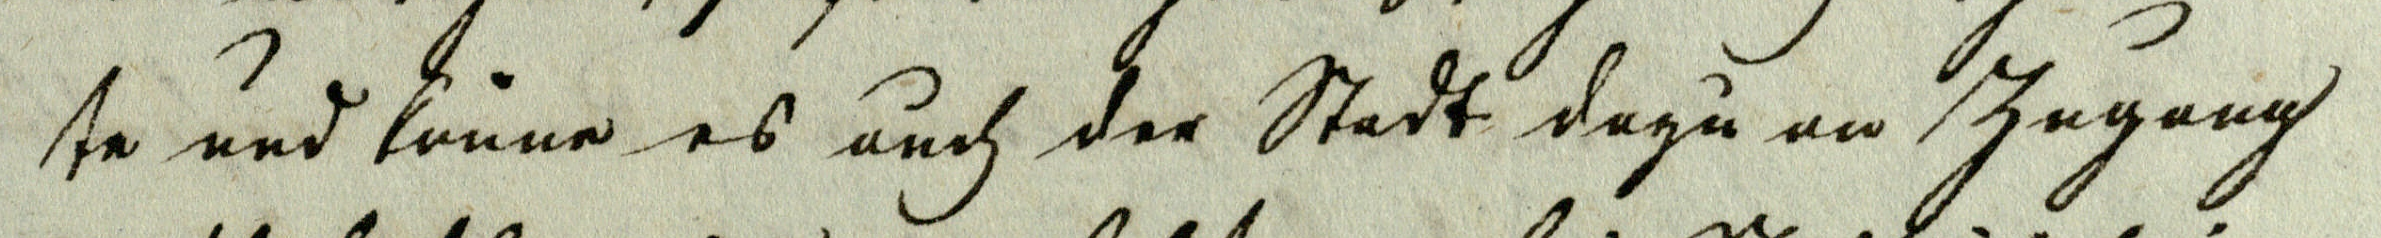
te und könne es auch der Stadt dazu an Zugang
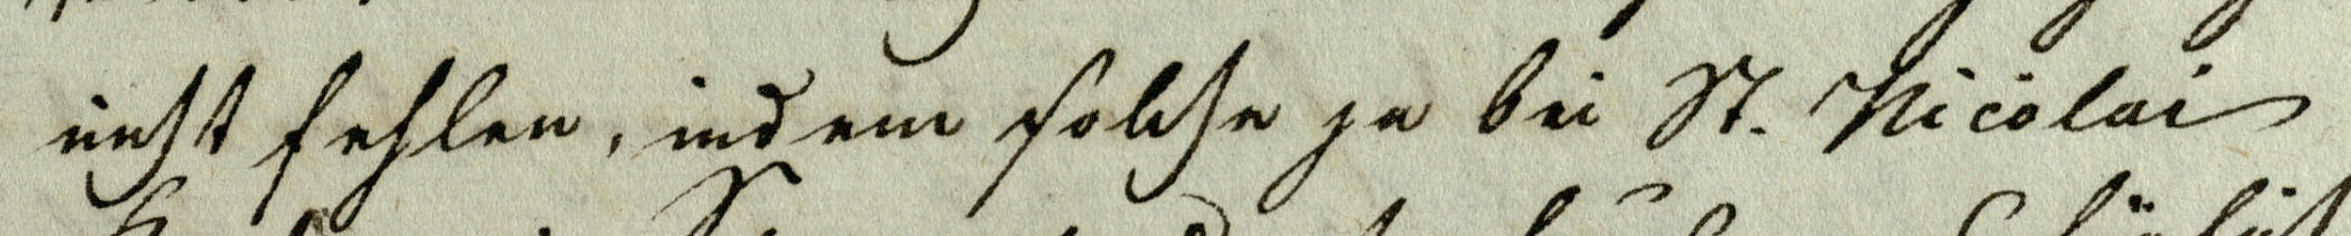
nicht fehlen, indem solche ja bei St. Nicolai
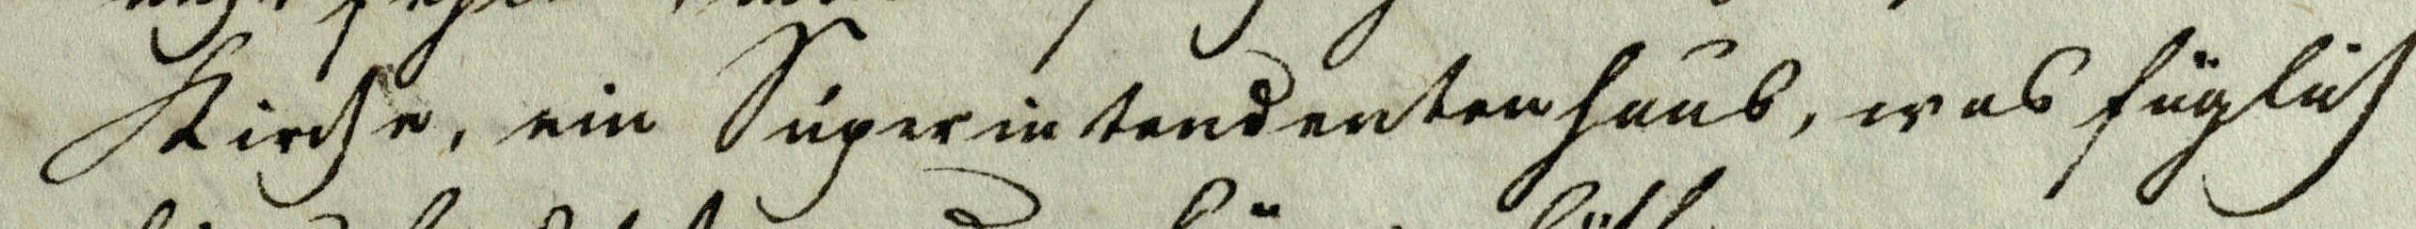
Kirche, ein Superintendentenhaus, was füglich
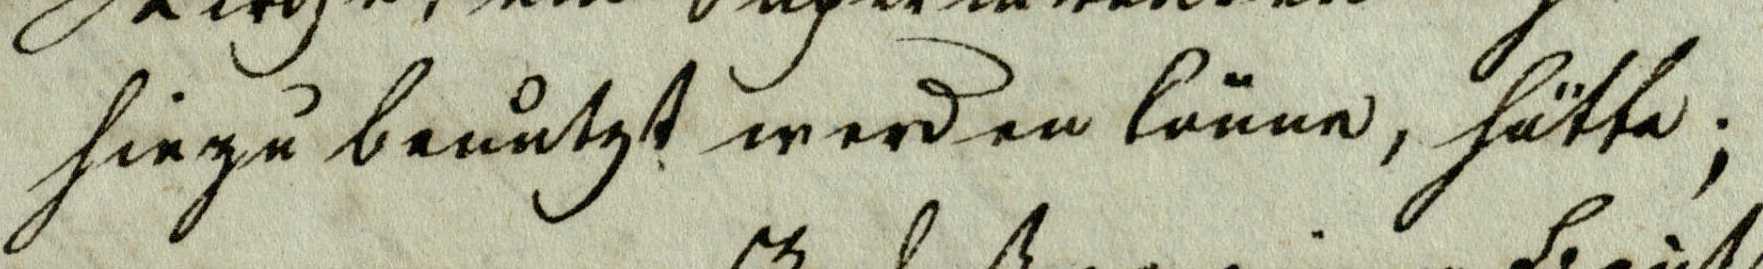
hiezu benutzt werden könne, hätte;
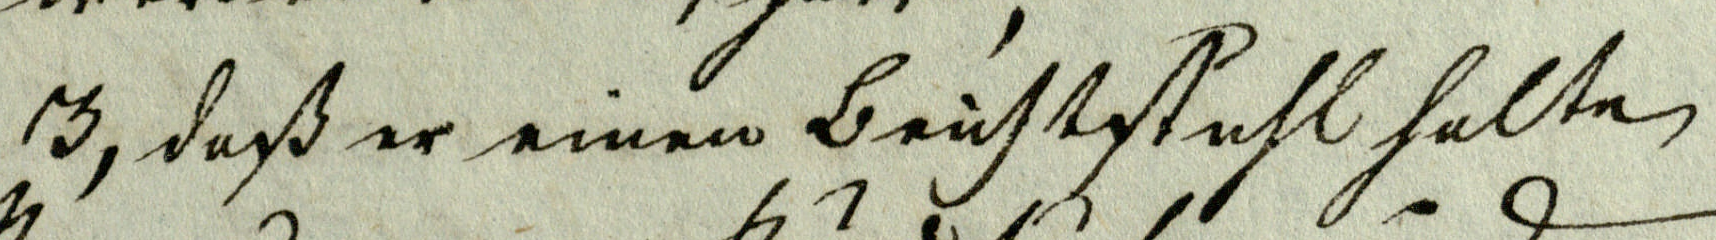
3, daß er einen Beichtstuhl halte,
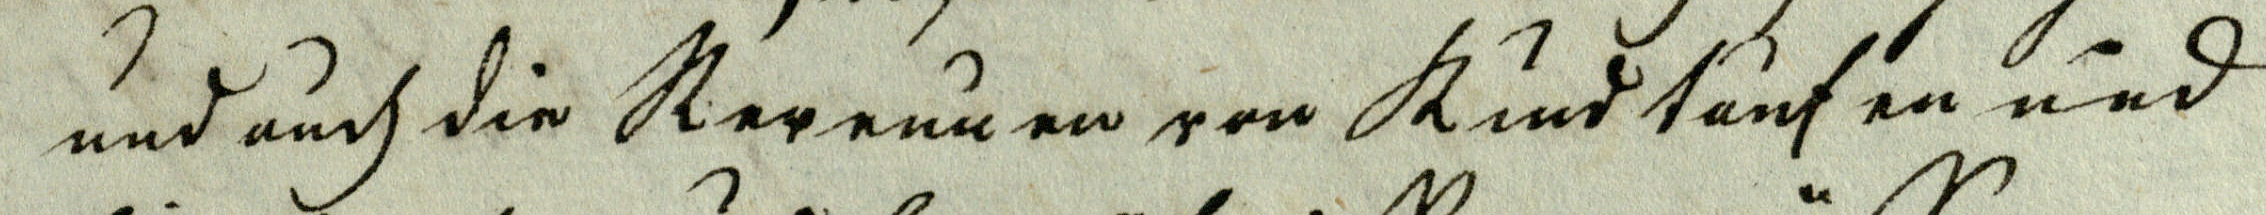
und auch die Revenuen von Kind taufen und
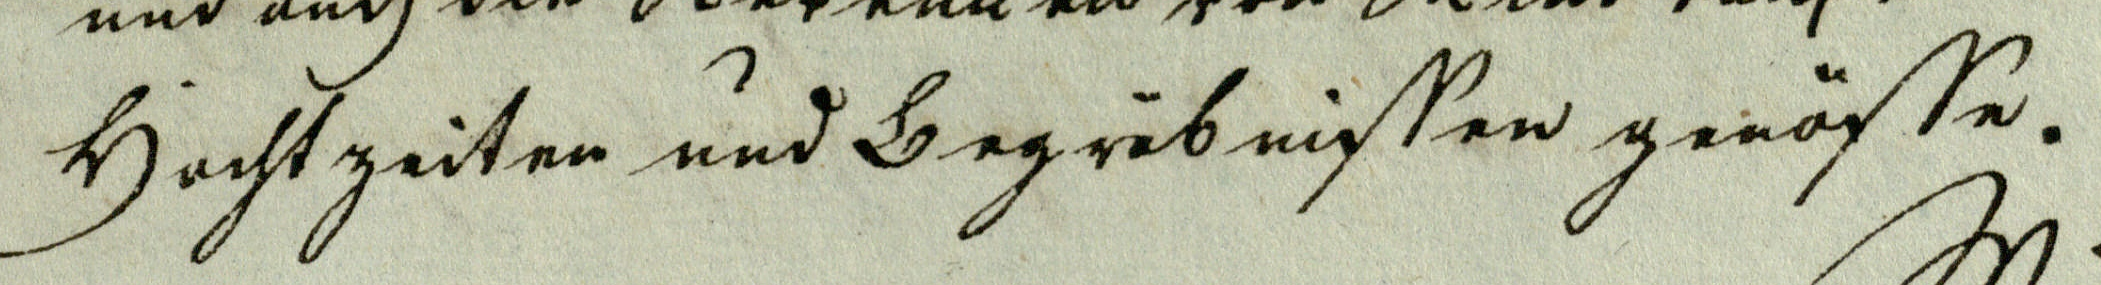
Hochtzeiten und Begräbnissen genösse.
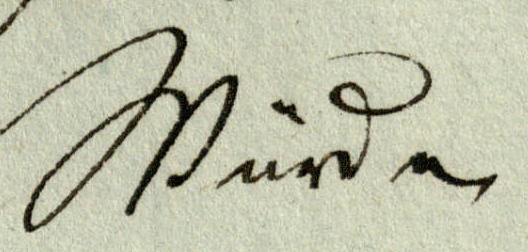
Würde
